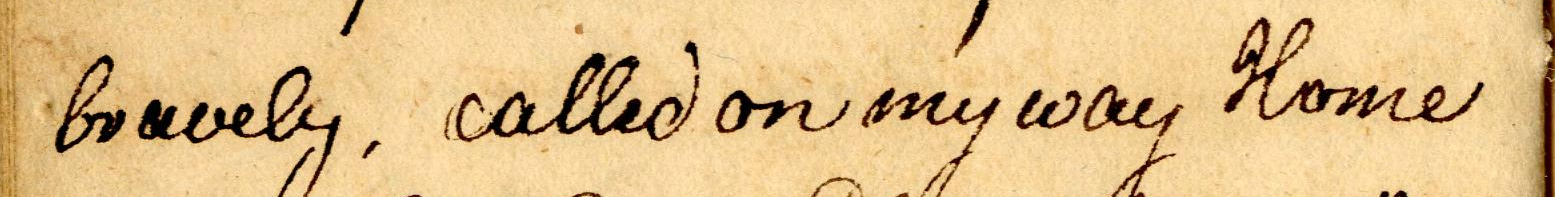bravely, called on my way Home
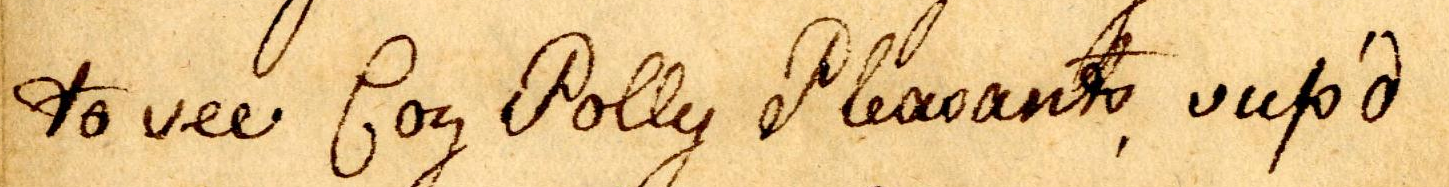to see Coz Polly Pleasants, sup'd
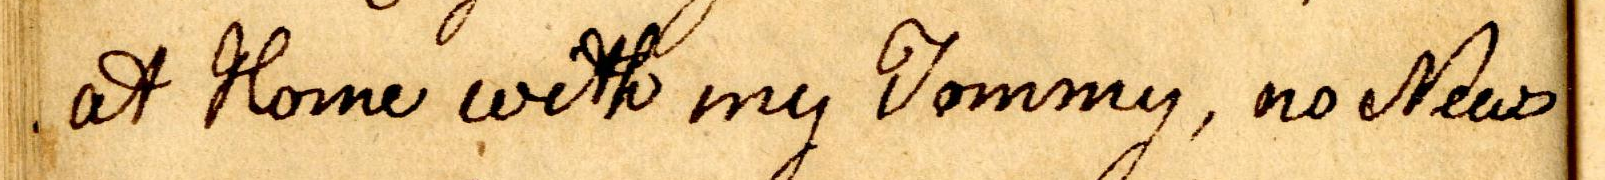at Home with my Tommy, no News
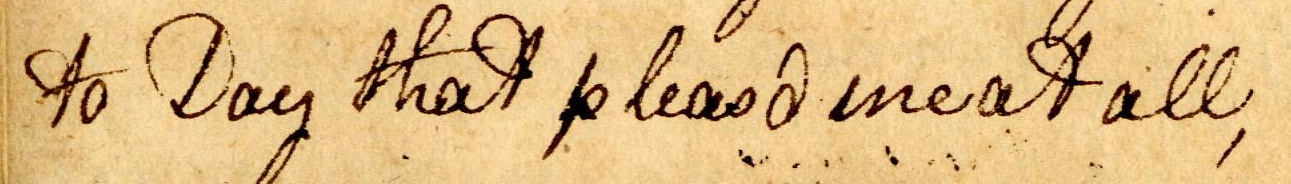to Day that pleasd me at all,
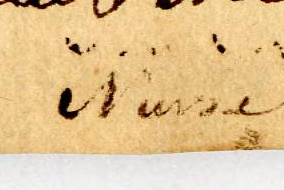Nurse
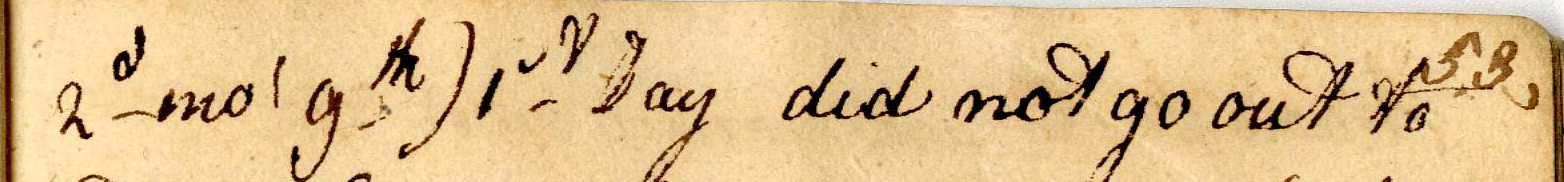2^d mo' 9^th ) 1^st Day did not go out to ^53
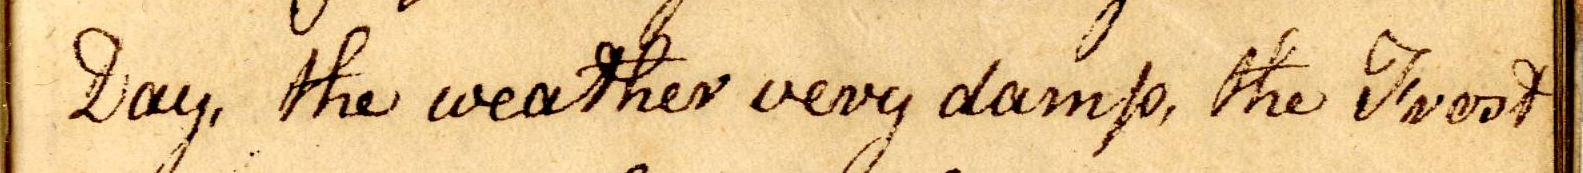Day, the weather very damp, the Frost
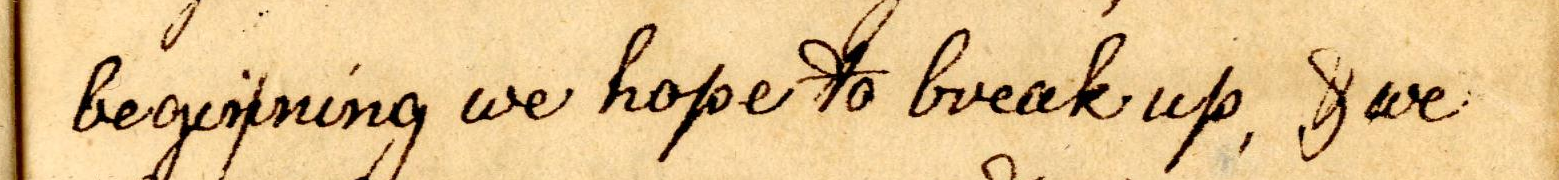beginning we hope to break up , & we
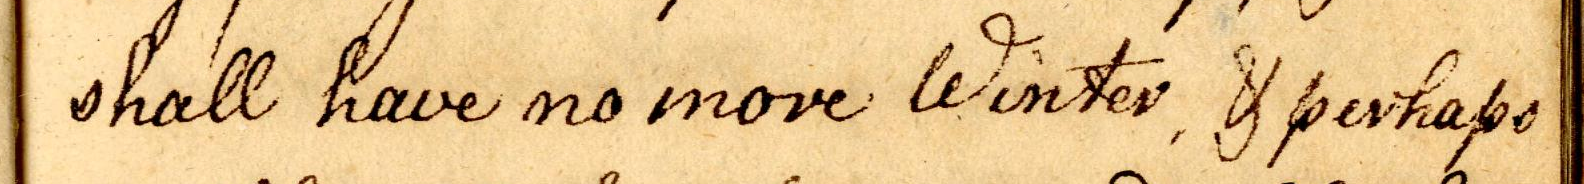shall have no more Winter, & perhaps
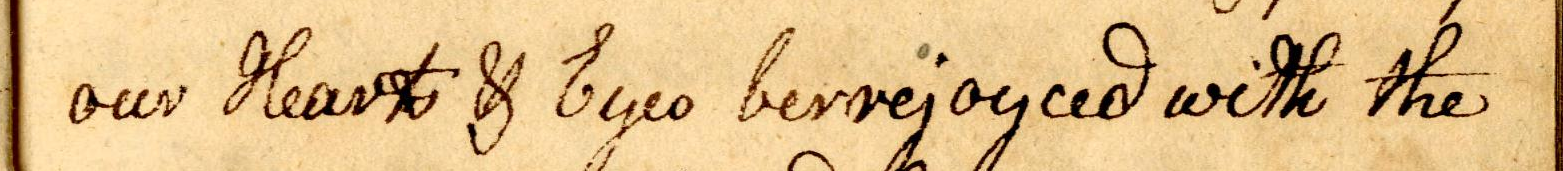our Heart & Eyes ber rejoyced with the
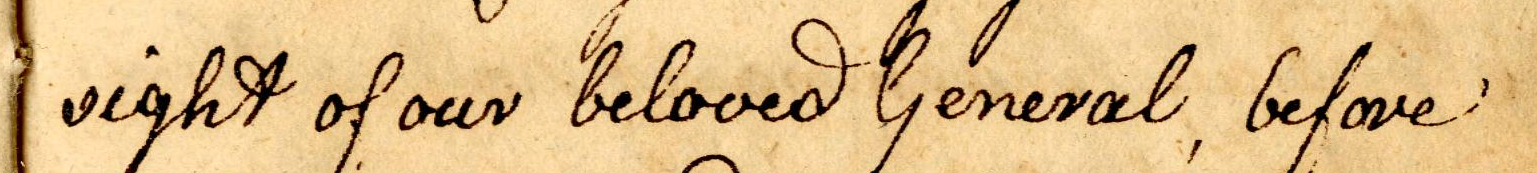sight of our beloved General, before
